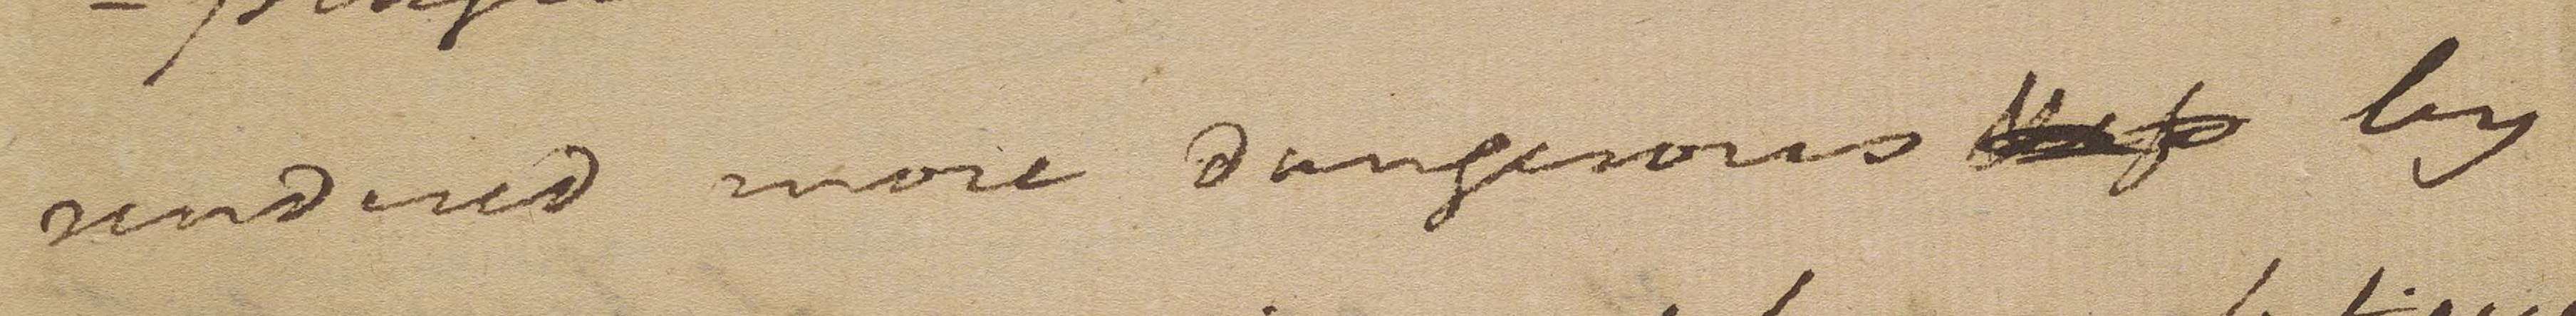rendered more dangerous [& a f] by
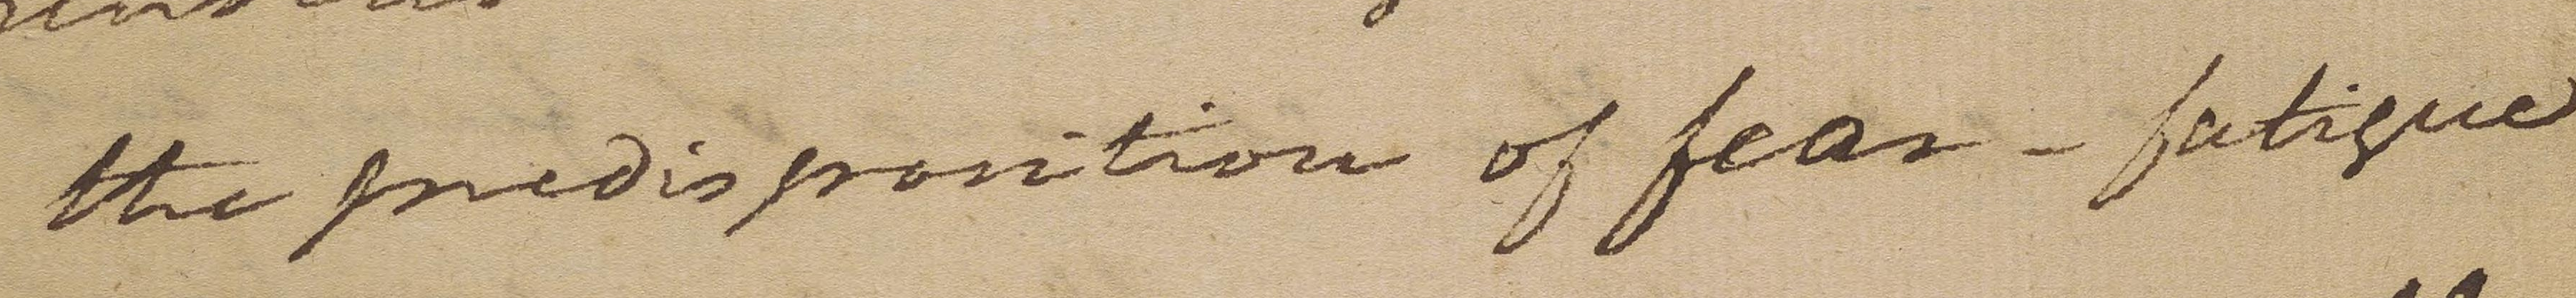the predisposition of fear- fatigue
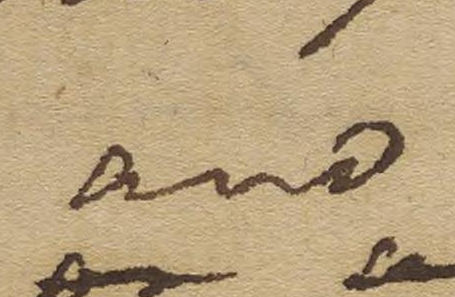and
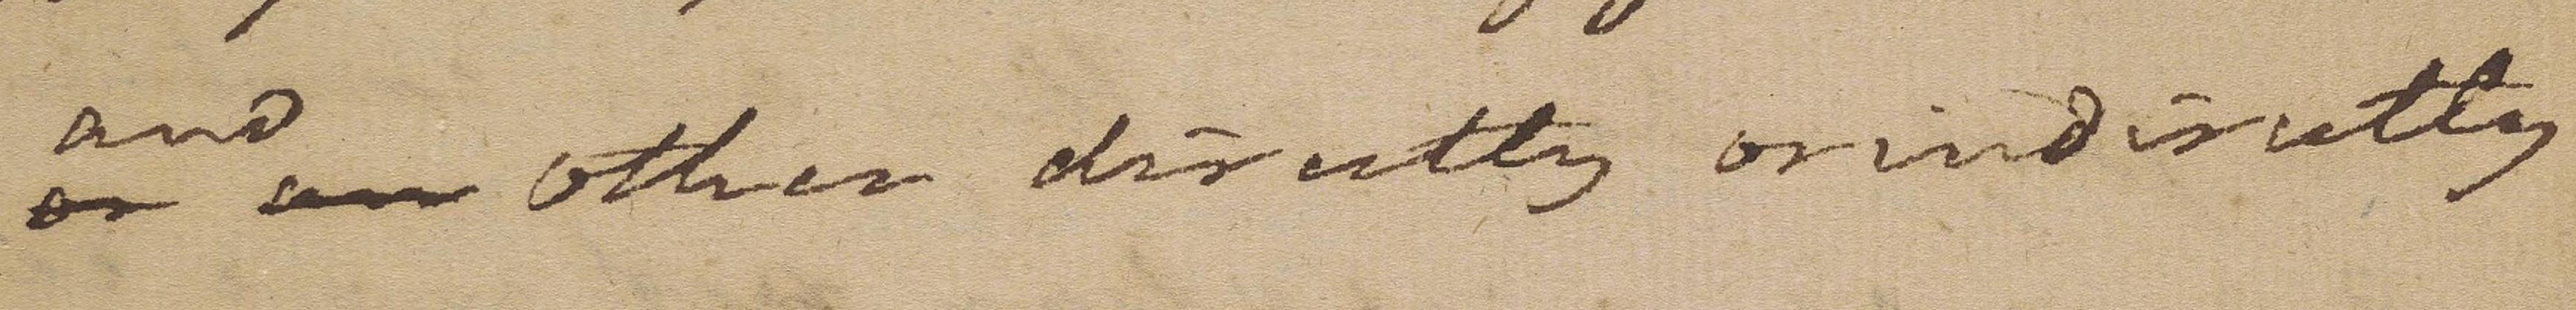or [an] other directly or indirectly
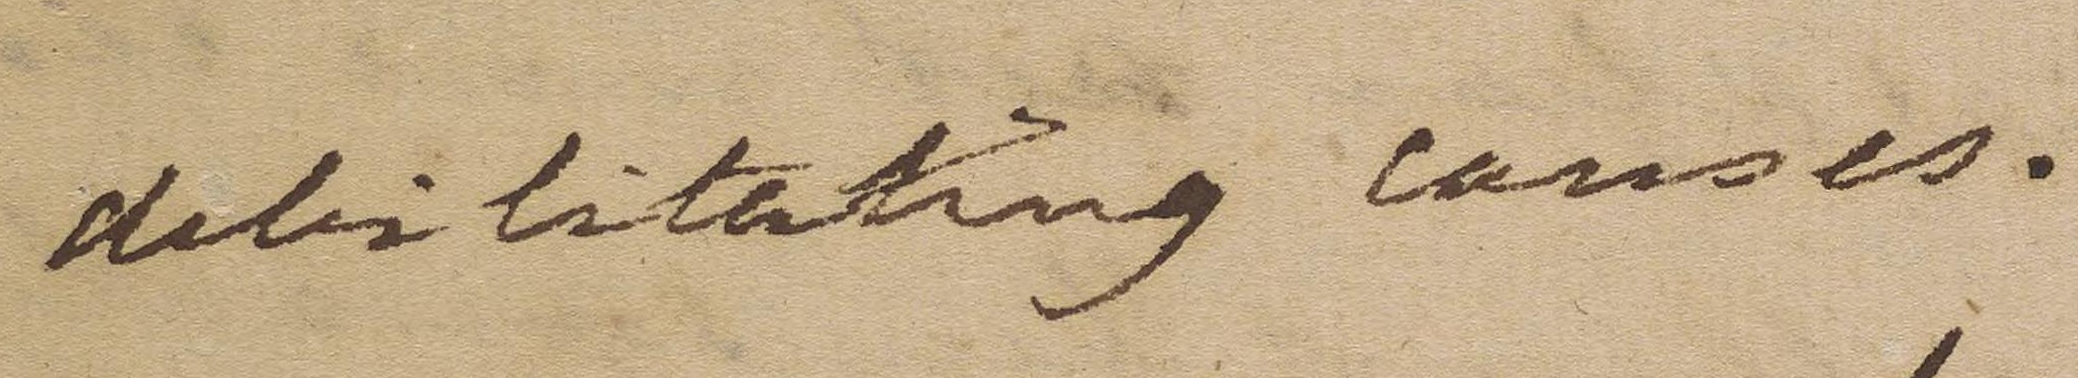debilitating causes.
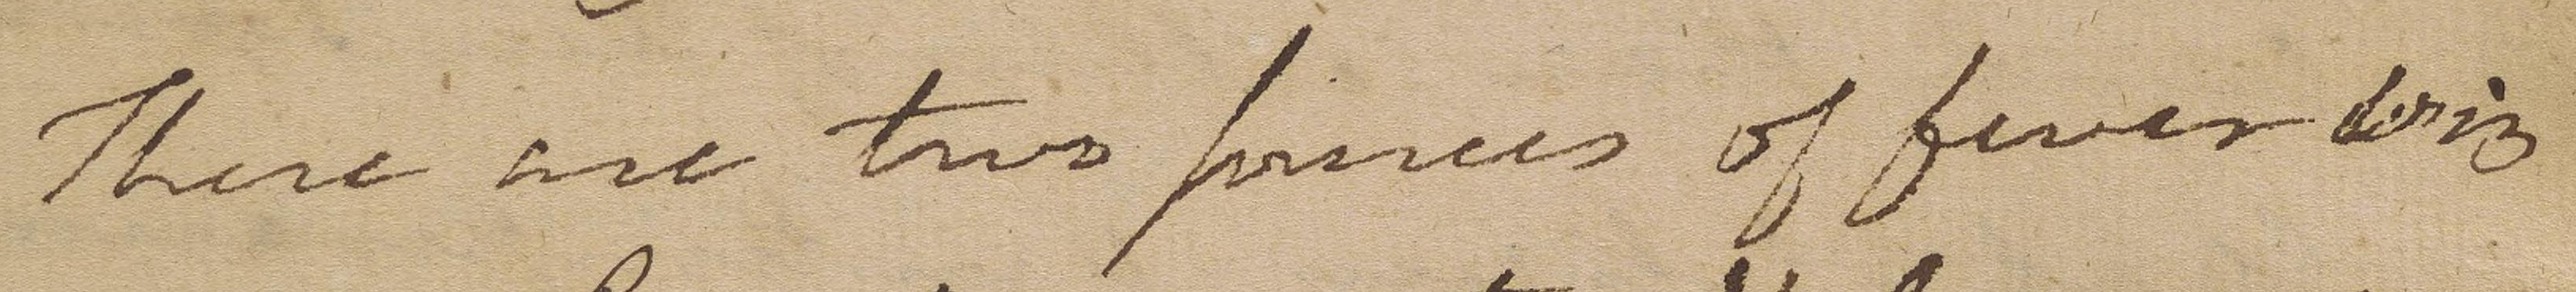There are two forces of fever
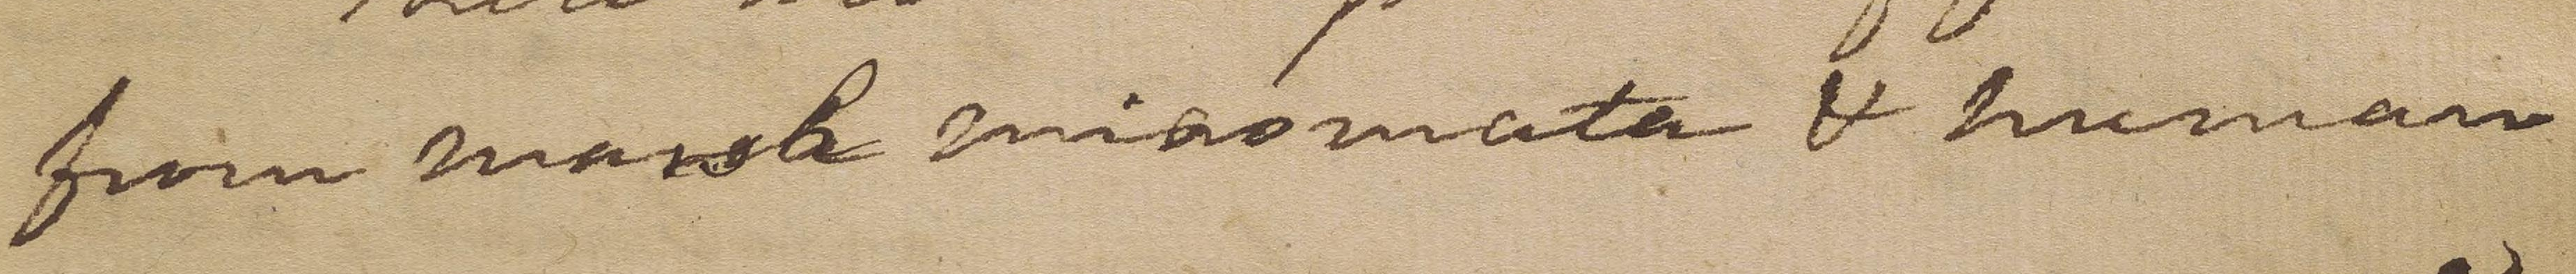from marsh miasmata & human
